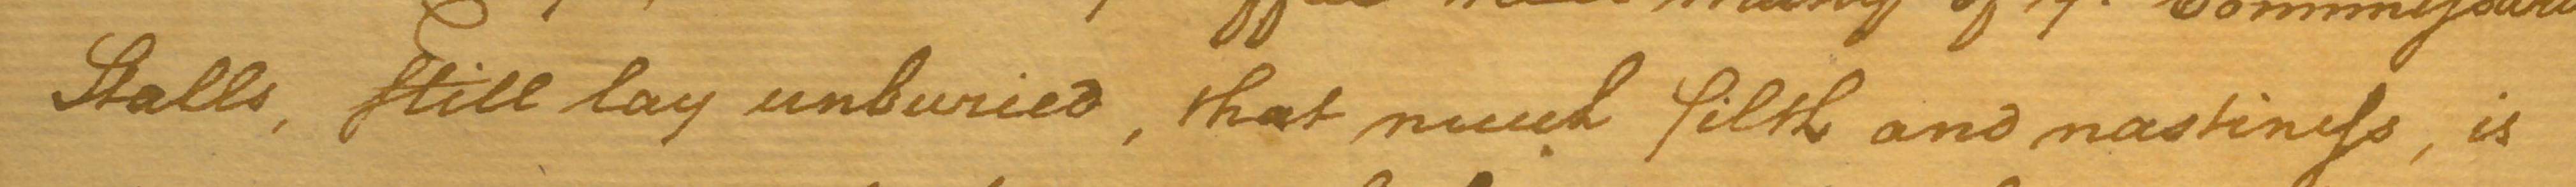Stalls, still lay unburied, that much filth and nastiness, is
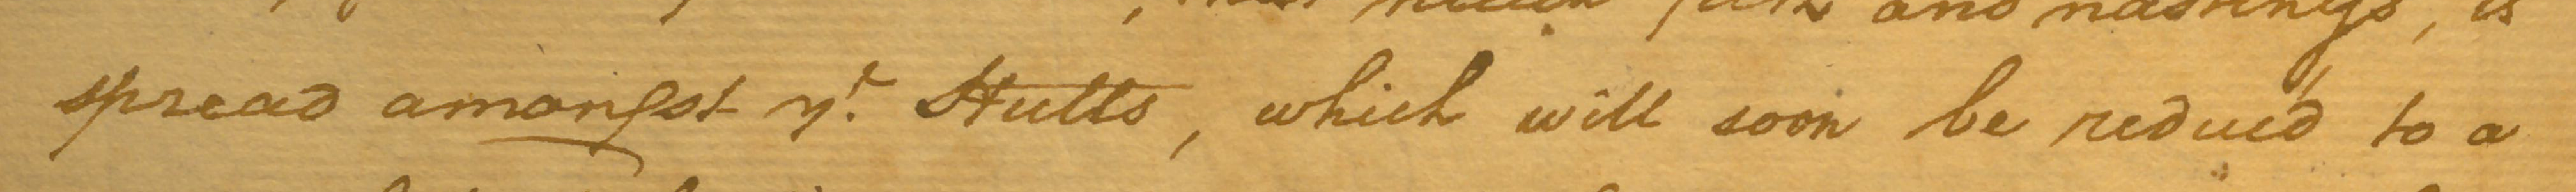spread amongst y^e. Hutts, which will soon be reduc'd to a
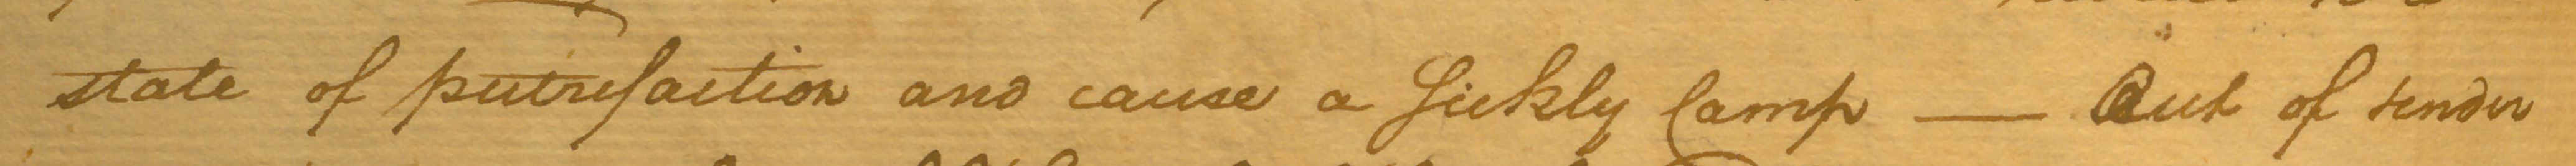state of putrifaction and causes a sickly Camp- Out of tender
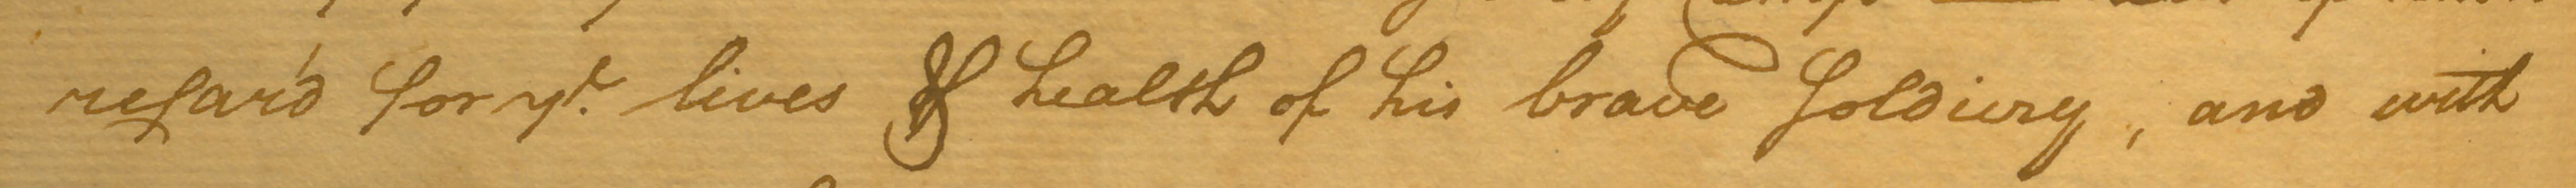regar'd for y^e. lives & health of his brave soldiery, and with
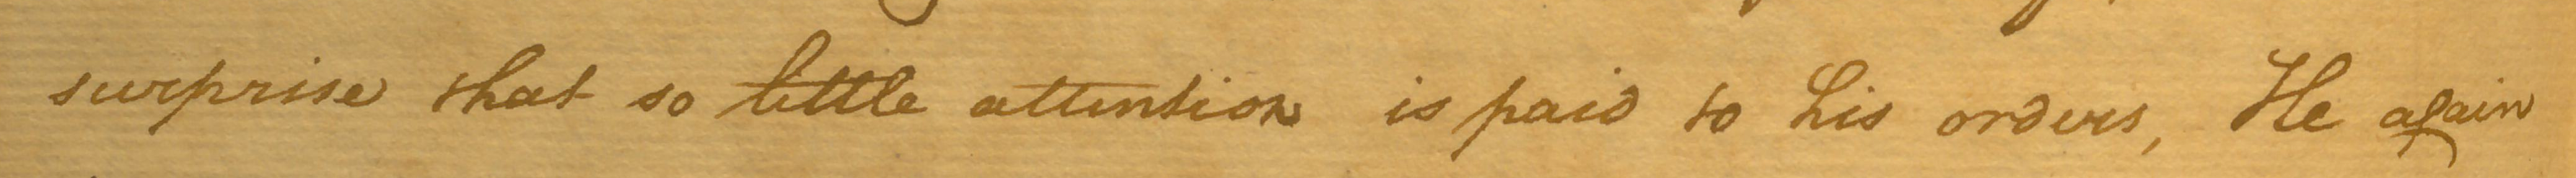surprise that so little attention is paid to his orders. He again
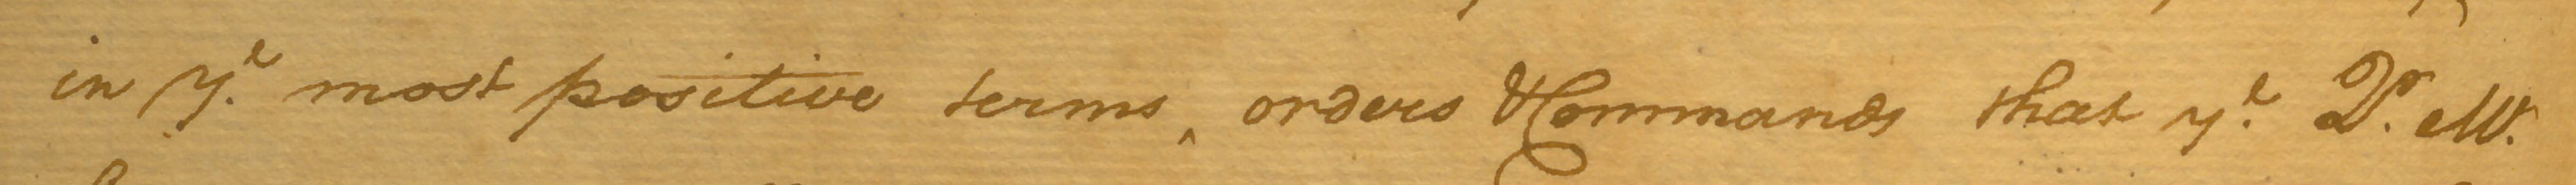in y^e. most positive terms, orders & Commands that y^e. Q^r. M.
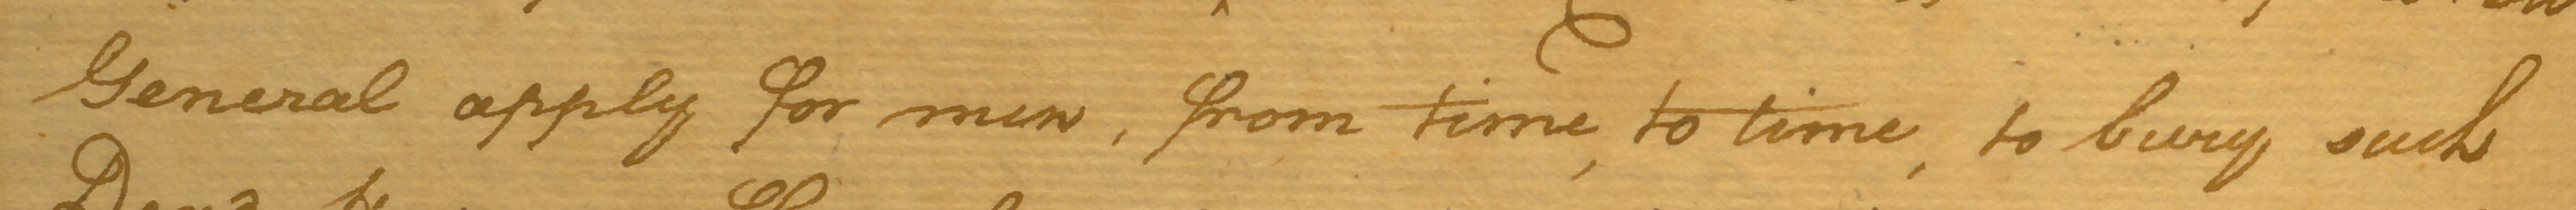General apply for men, from time to time, to bury such
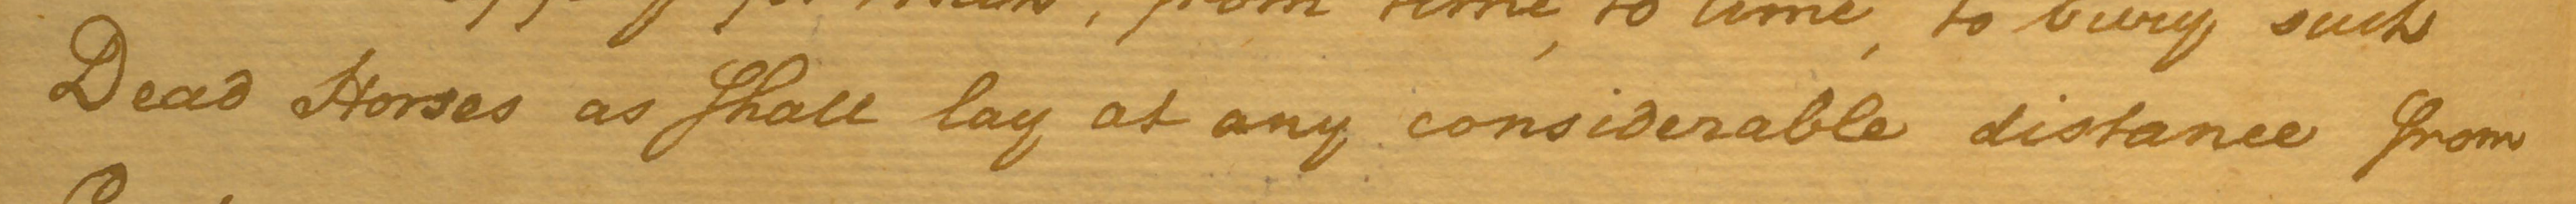Dead Horses as shall lay at any considerable distance from
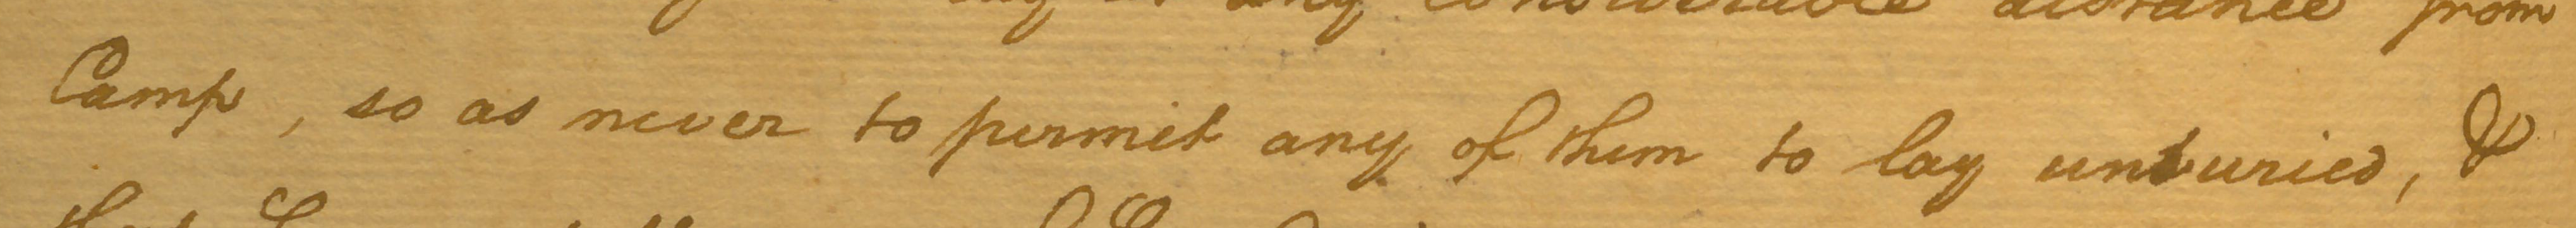Camp, so as never to permit any of them to lay unburied, &
